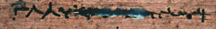γλαυ νωνι
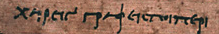χαιρειν γραφειϲμοιπερι
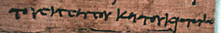τουϲηϲαμου καιτουκροτωνοϲ
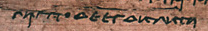παρατοδεεγδημηϲαι
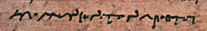απολλωνιοντονπροϲτωι
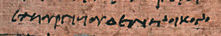ελαιουργιωιουδεμιανοικονο
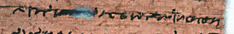μιαν αϲθηνποιηϲαϲθαι
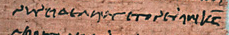νυνειδεπαραγεγονεντηικϛ
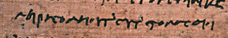πειραϲομαιουνϲυντομωϲδιοι
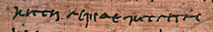κηϲαιπεριδετηϲλειαϲ
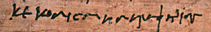κεκομιϲμαιπαραφανιου
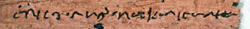επιϲτοληνοπωϲκομιϲωμεθα
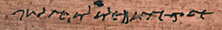τηνλειαν ανεβαλλετοδε
